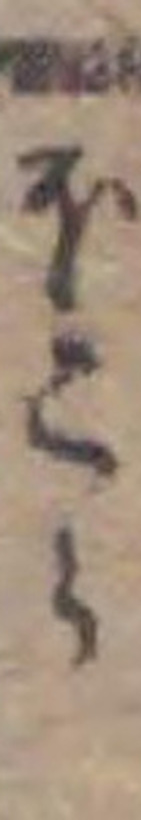ほこら
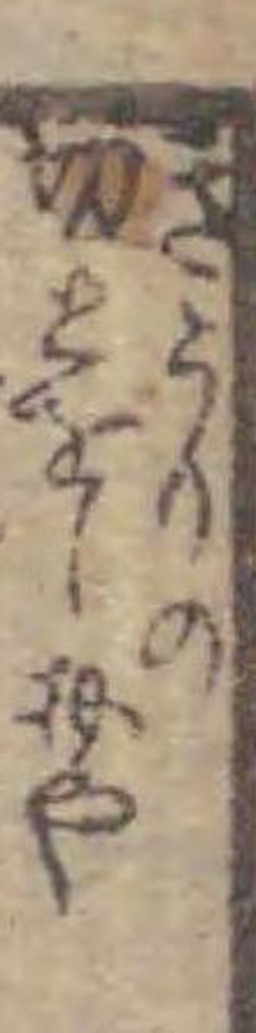切とをしおや
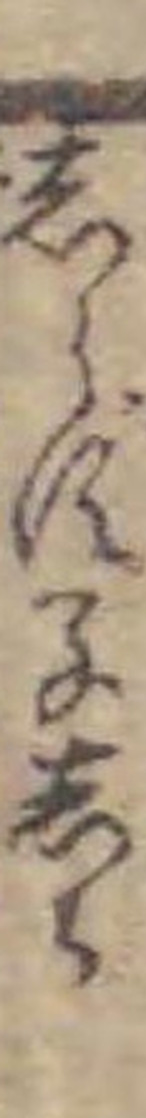しらず子しら
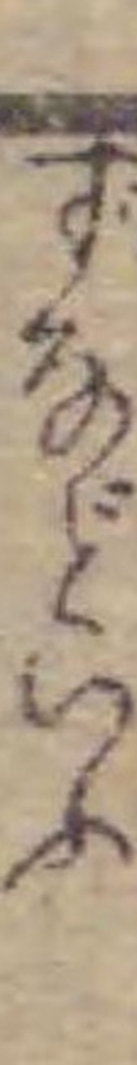ずなどいふ
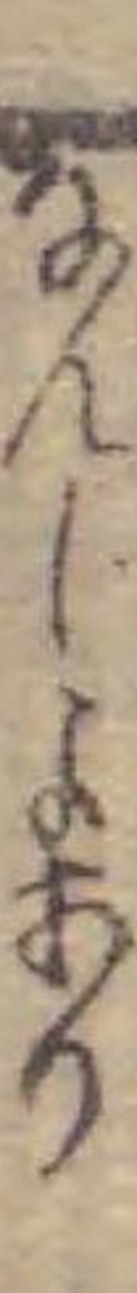なんしよあり
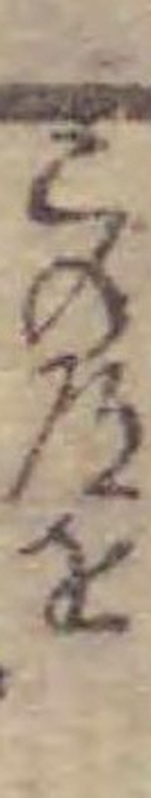この道を
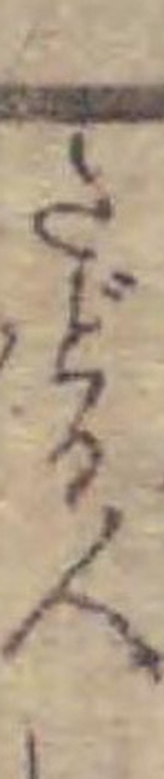たどる人
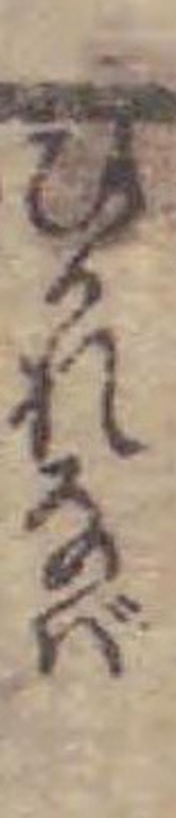ひかれなば
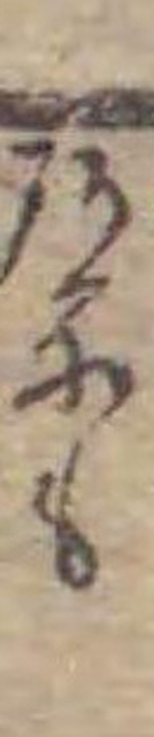道にも

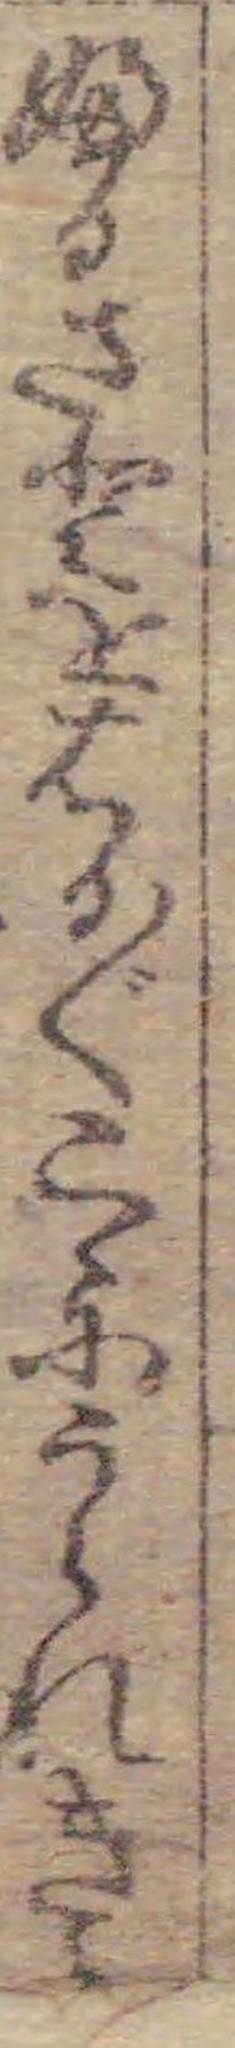ふるさとをはる〴〵こゝにうられきて
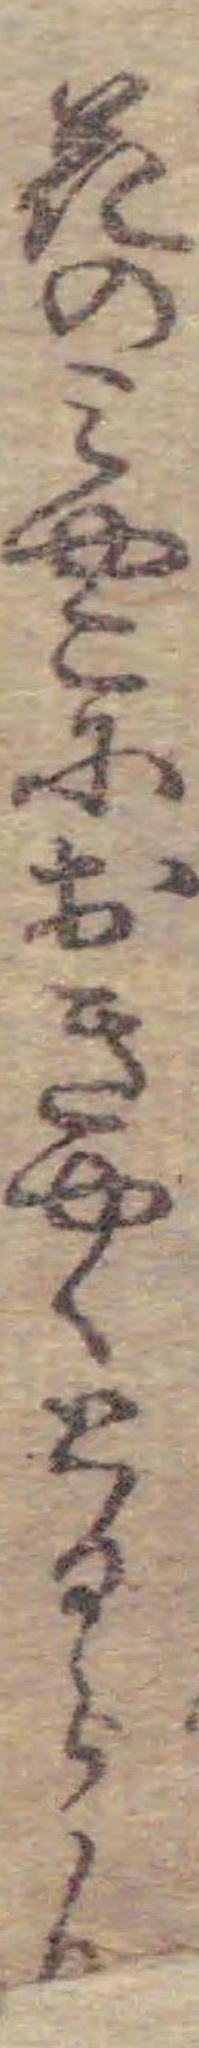花のみやこにおきやくとるらん
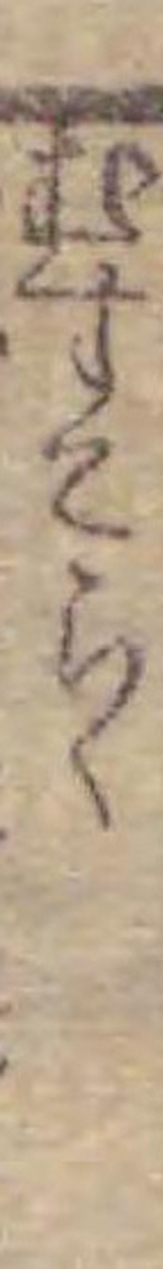むすこらく
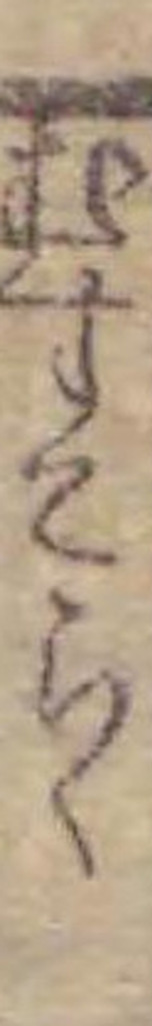むすこらく
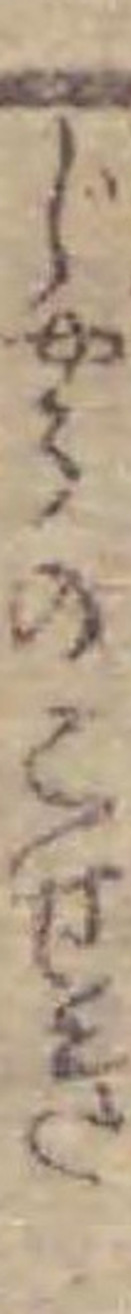じやうのこせき
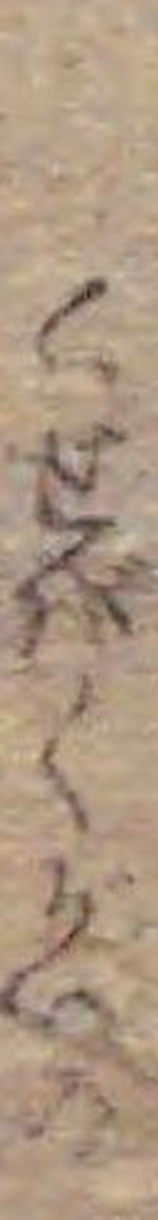こせばくがいの
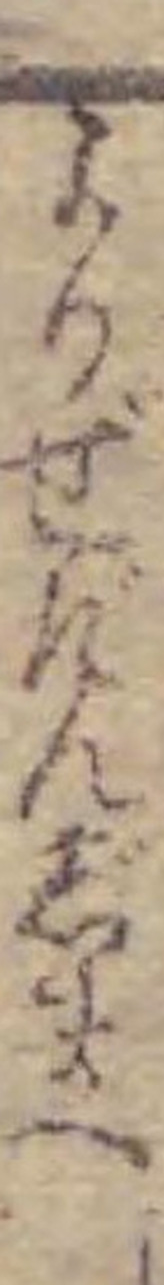よりぜげんじまへ
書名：北国順礼唄方便 : 3巻
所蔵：国立国会図書館 National Diet Library, JAPAN
